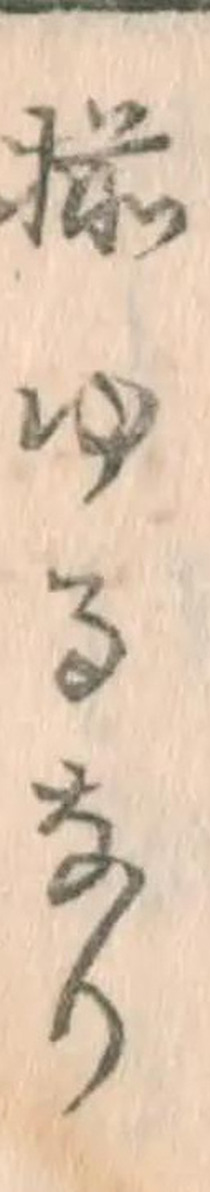揃ゆるなり
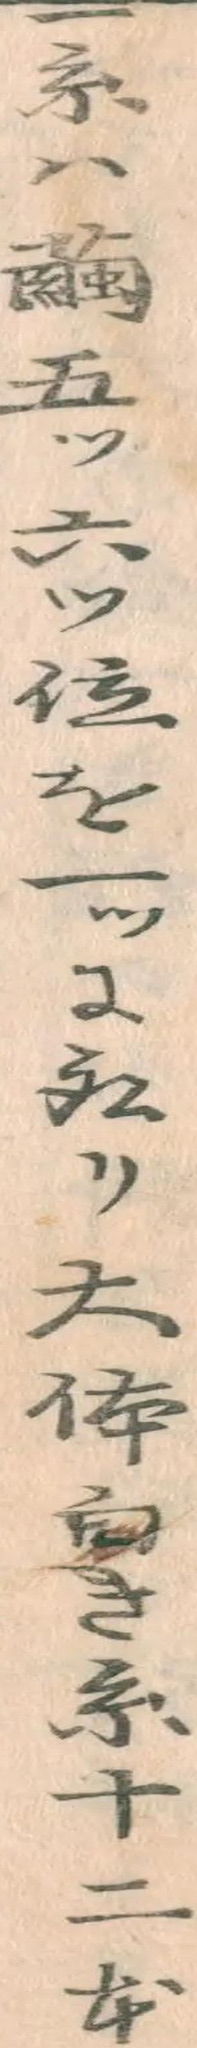一糸は繭五ッ六ッ位を一ッに取り大体白き糸十二本
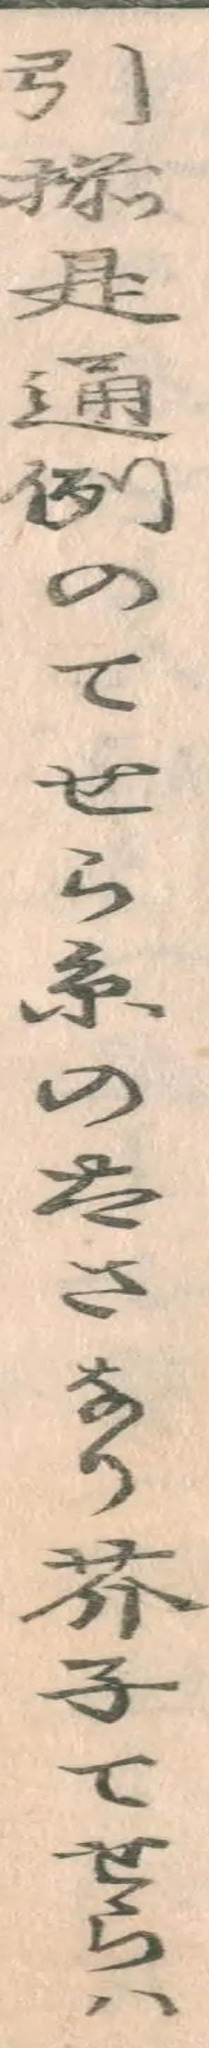引揃是通例のてせら糸の太さなり芥子てせらは
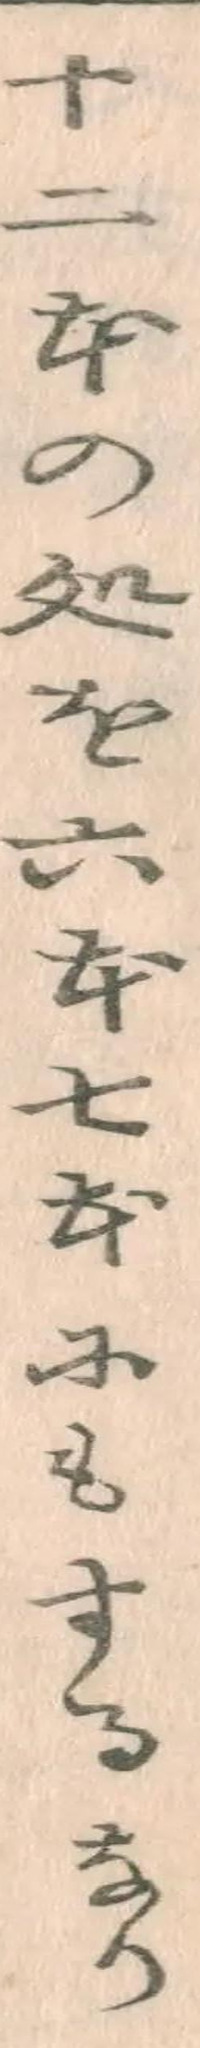十二本の処を六本七本にもするなり
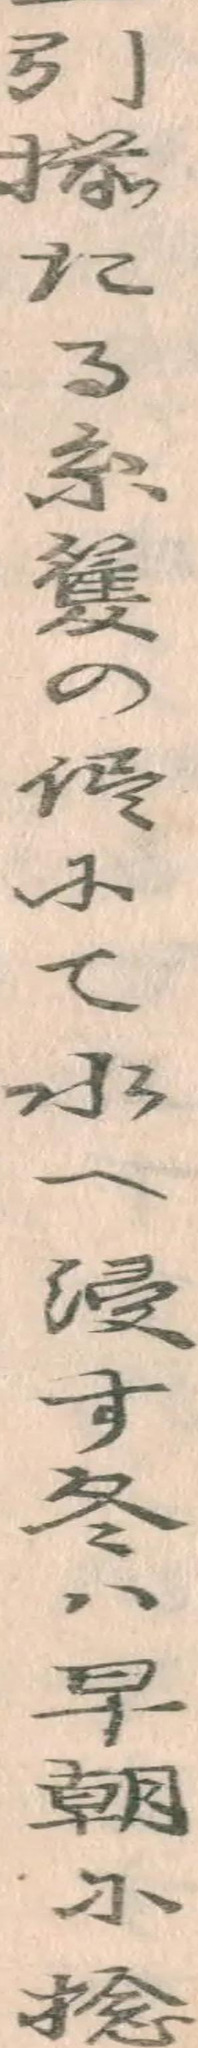一引揃たる糸篗の侭にて水へ浸す冬は早朝に捻
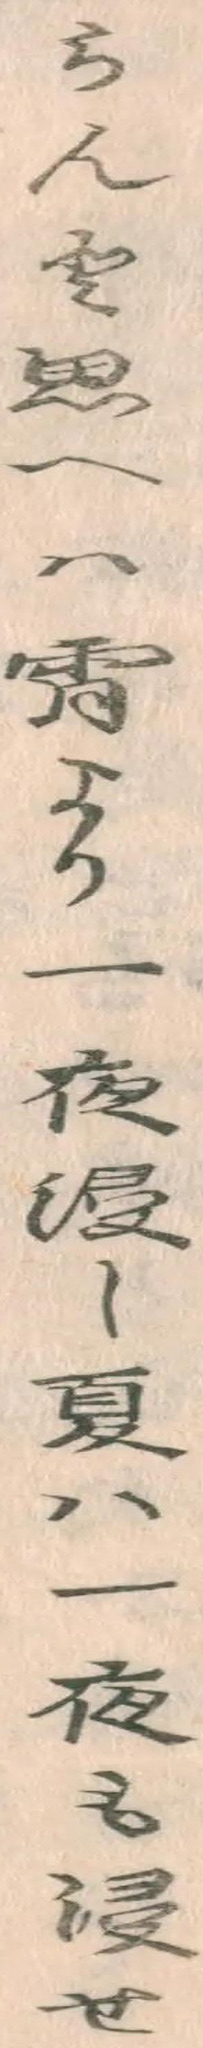らんと思へは宵より一夜浸し夏は一夜も浸せ
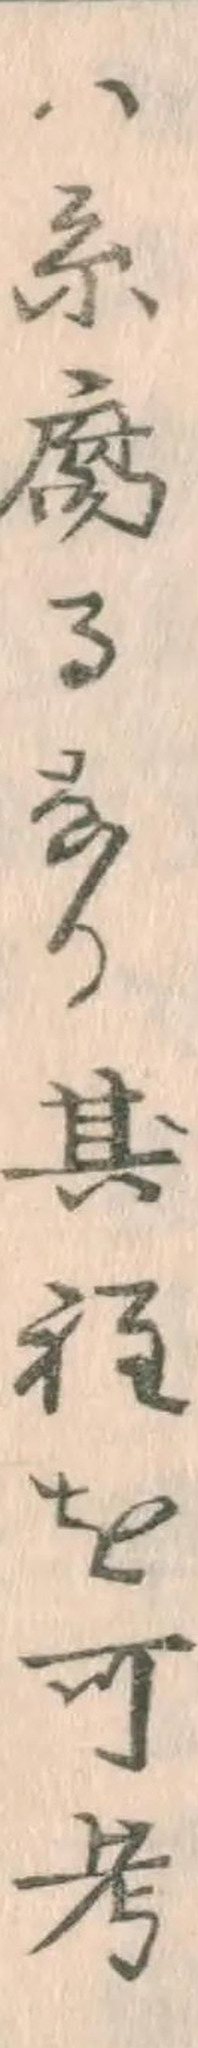は糸腐るなり其程を可考
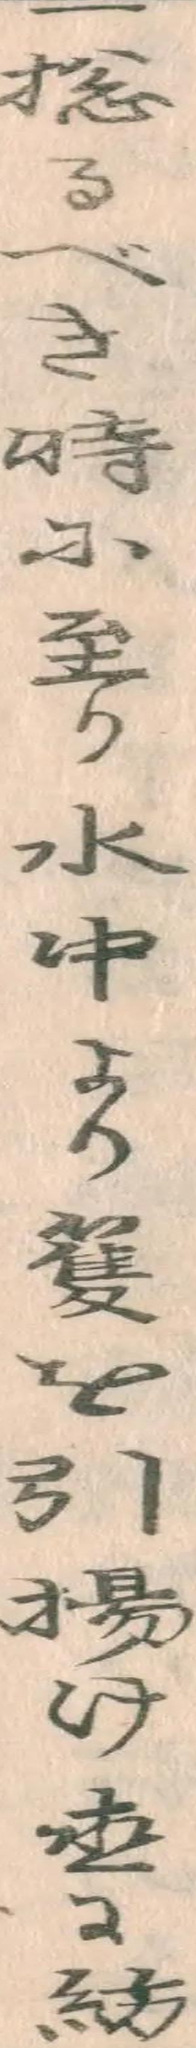一捻るべき時に至り水中より篗を引揚け直に紡
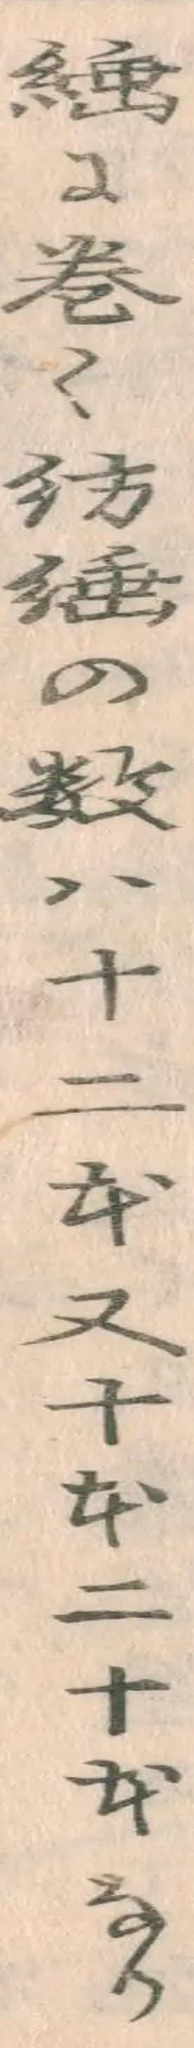綞に巻く紡綞の数は十二本又十本二十本なり
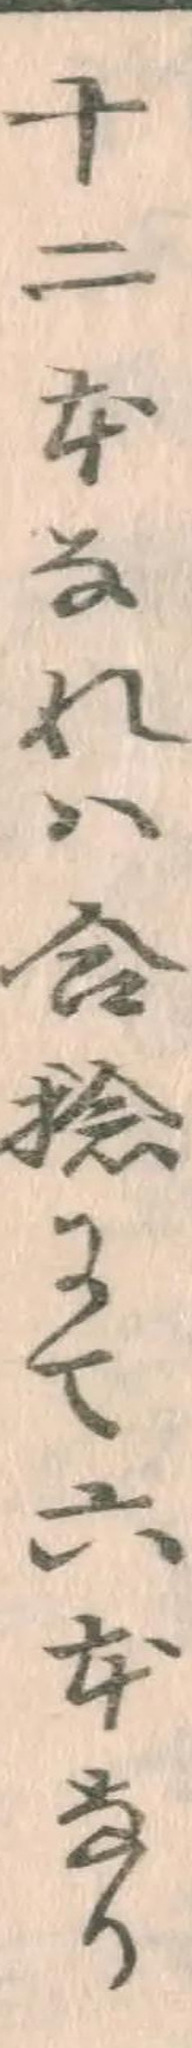十二本なれは合捻にて六本なり
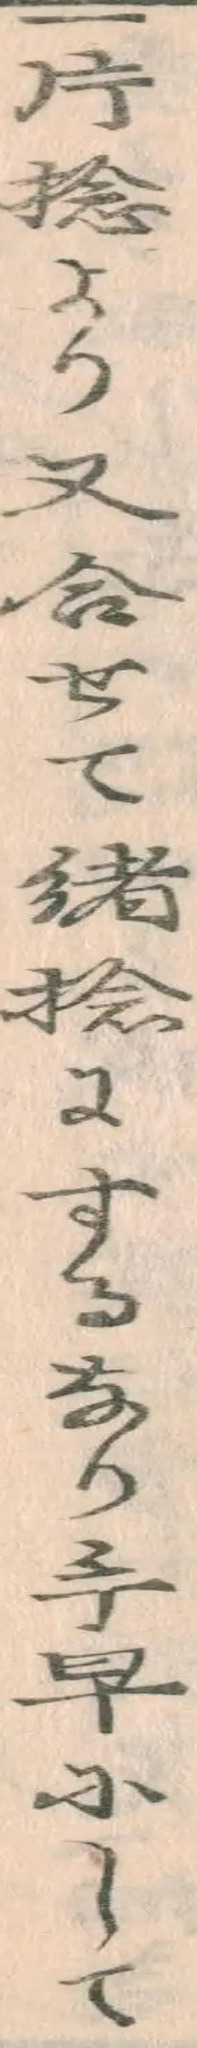一片捻より又合せて緒捻にするなり手早にして
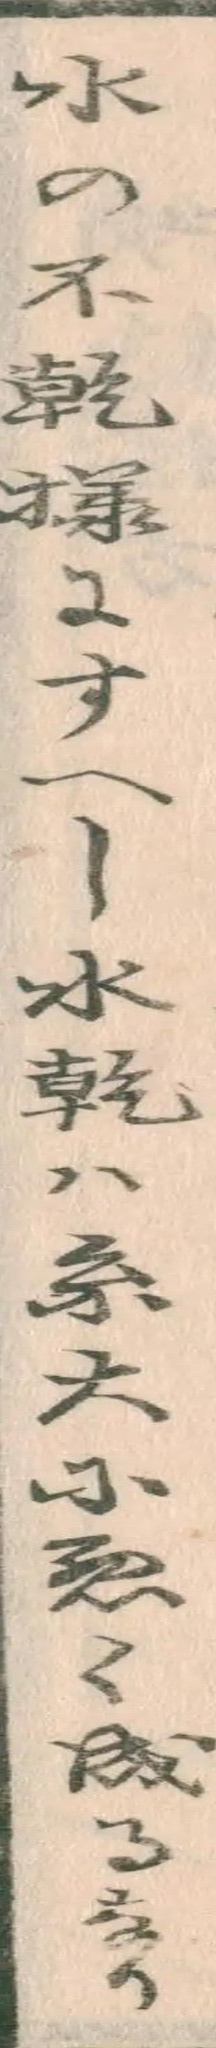水の不乾様にすへし水乾は糸大に悪く成るなり
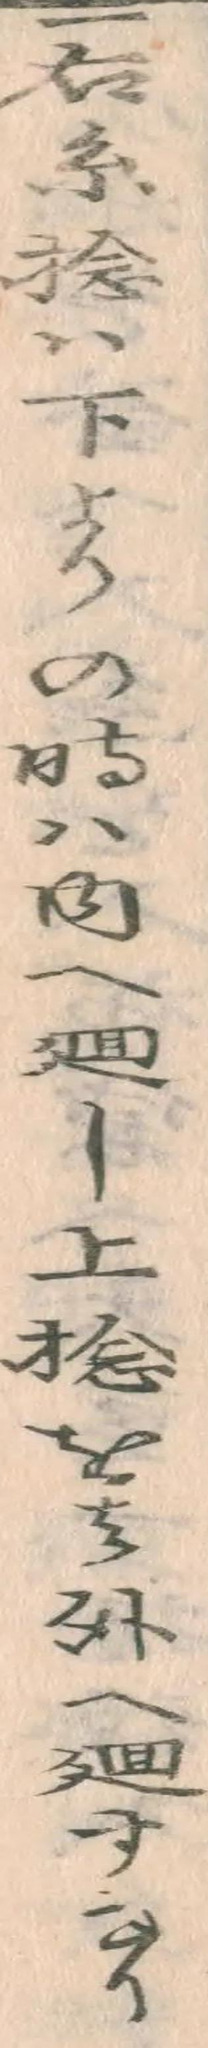一右糸捻は下よりの時は内へ廻し上捻をは外へ廻すなり
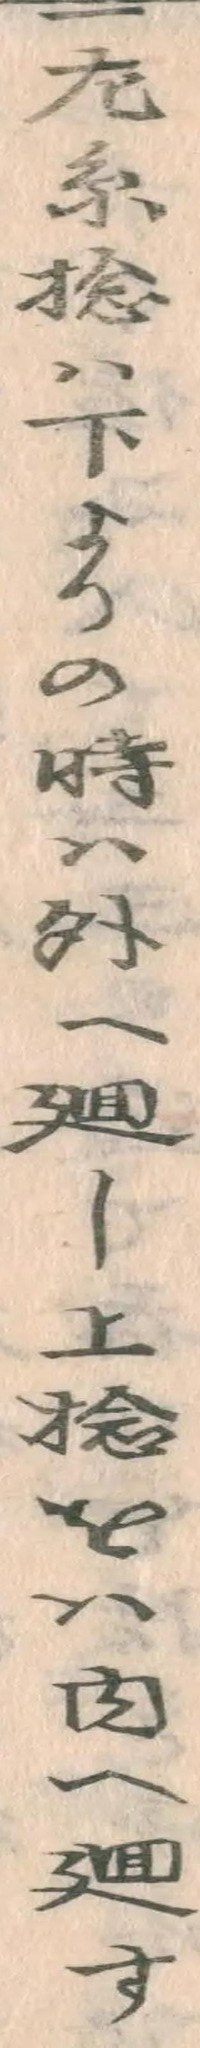一左糸捻は下よりの時は外へ廻し上捻をは内へ廻す
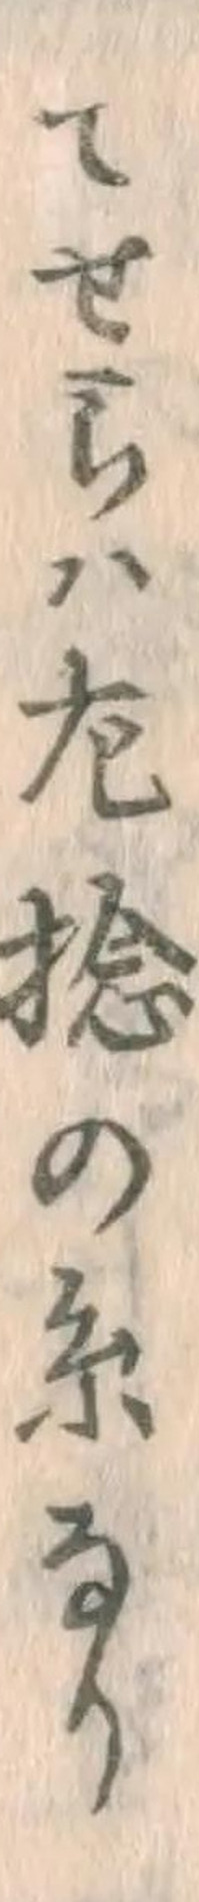てせらは左捻の糸なり
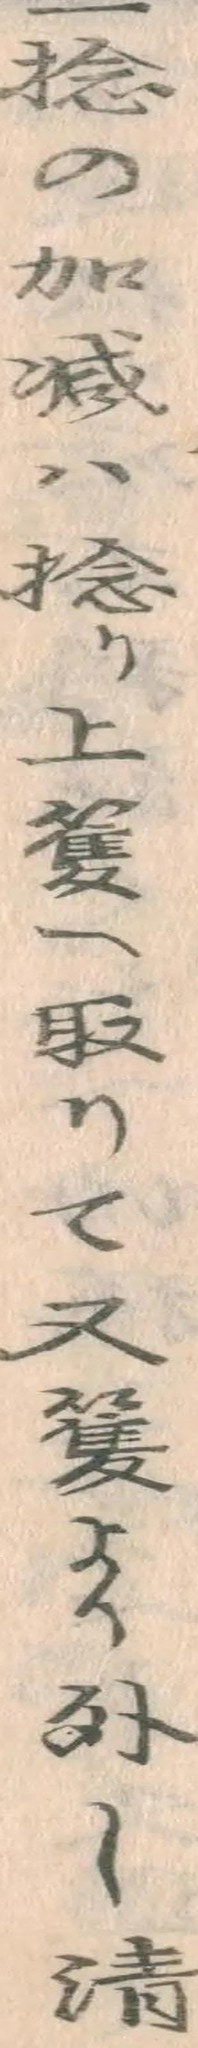一捻の加減は捻り上篗へ取りて又篗より外し清
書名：機織彙編 5巻. [1]
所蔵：国立国会図書館 National Diet Library, JAPAN
